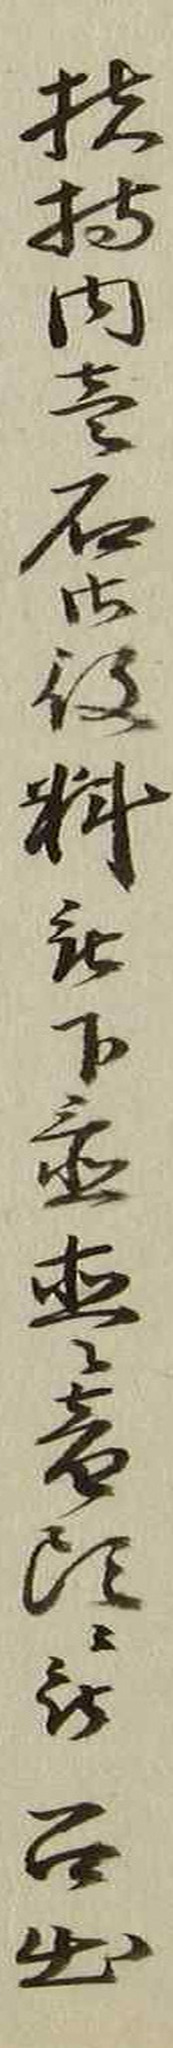扶持内壱石御役料被下置直ニ音頭ニ被召出
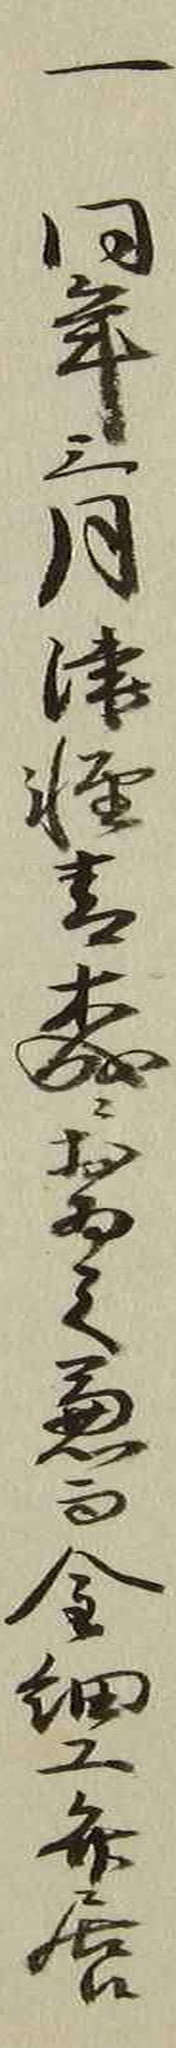一同年三月津軽青森ニおゐて兼而金細工弁居候
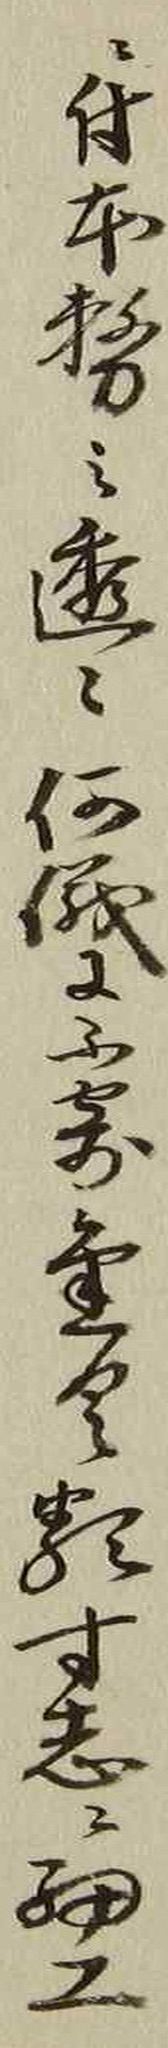ニ付本務之透々何儀に不寄金具類寸志ニ細工
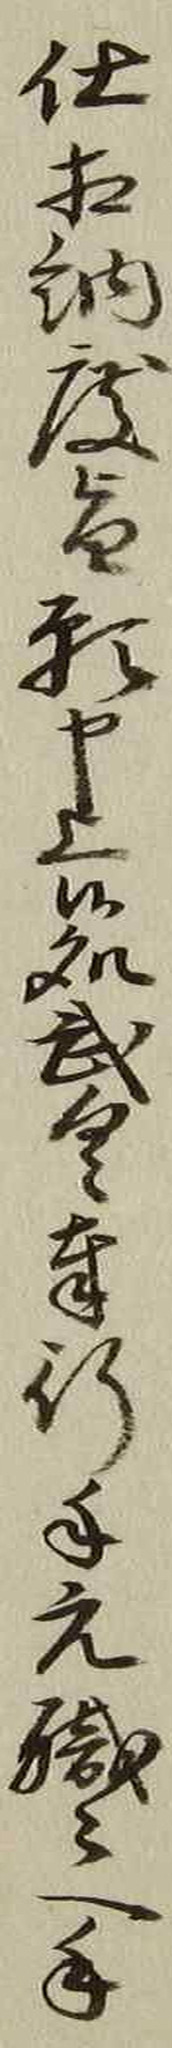仕相納度旨願申上候処武具奉行手元職々へ手
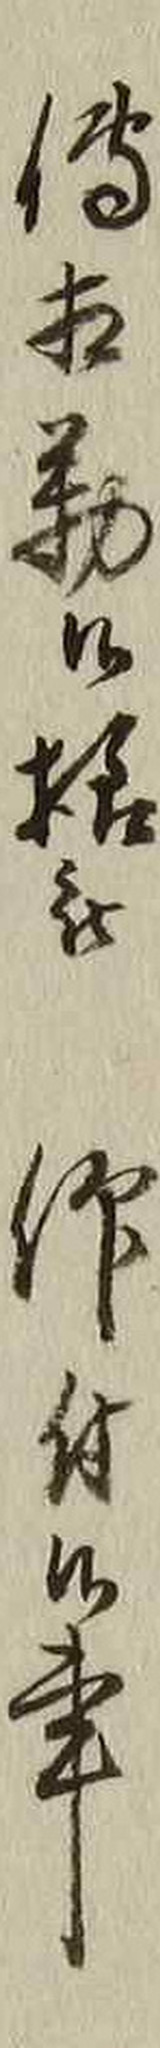伝相勤候様被仰付候事
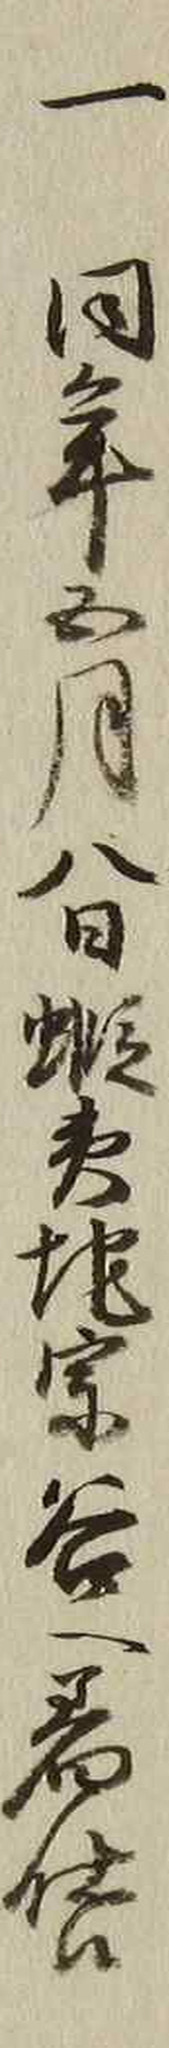一同年五月八日蝦夷地宗谷へ着仕候
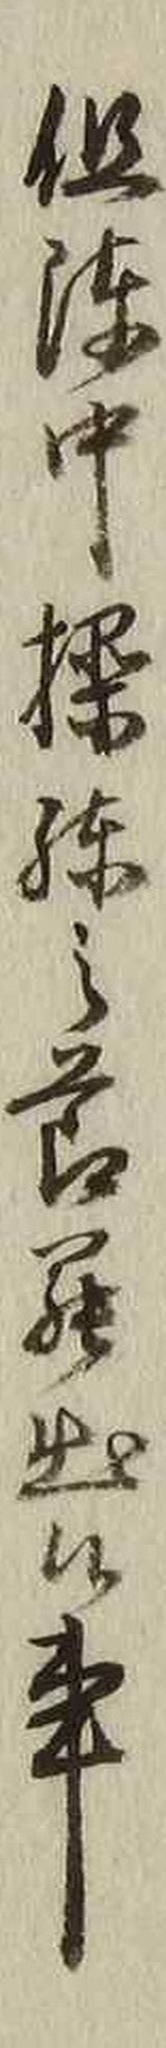但陣中操練之節罷出候事
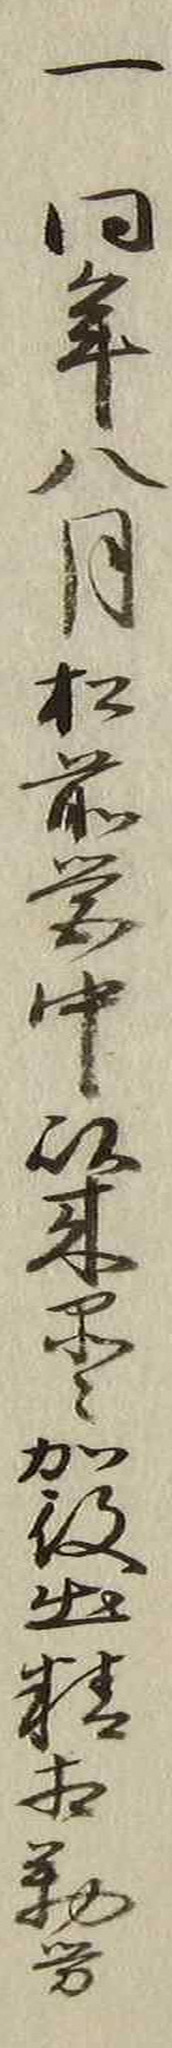一同年八月松前営中以来品々加役出精相勤労
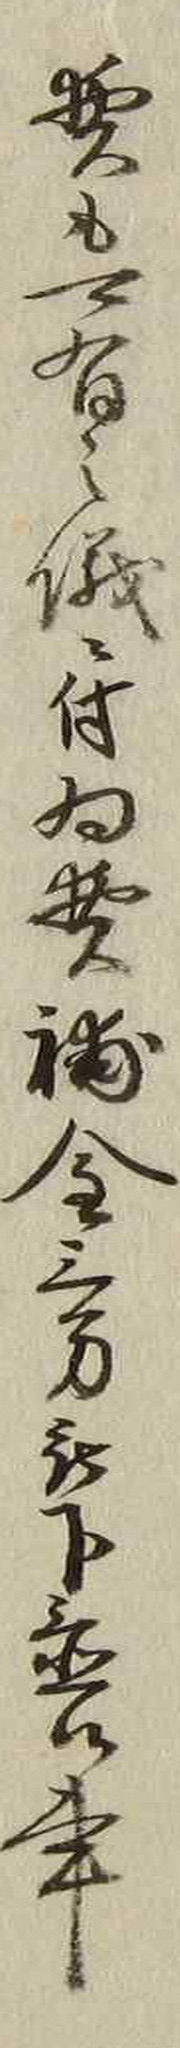費も可有之儀ニ付為費補金三分被下置候事
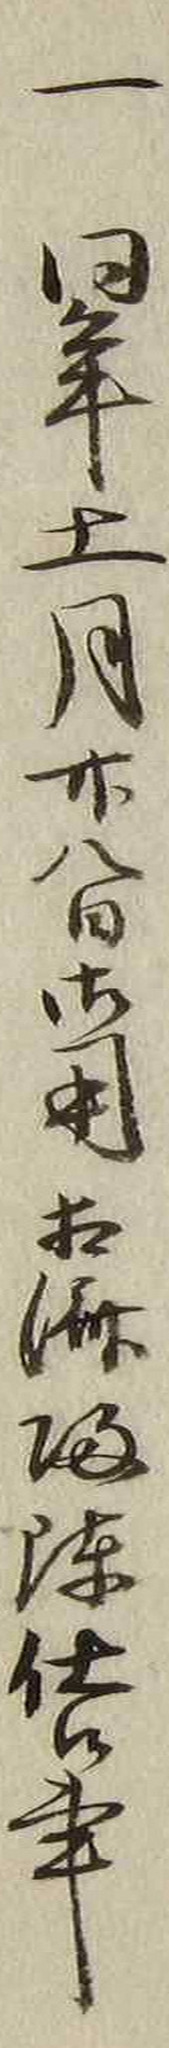一同年十一月廿八日御用相済帰陣仕候事
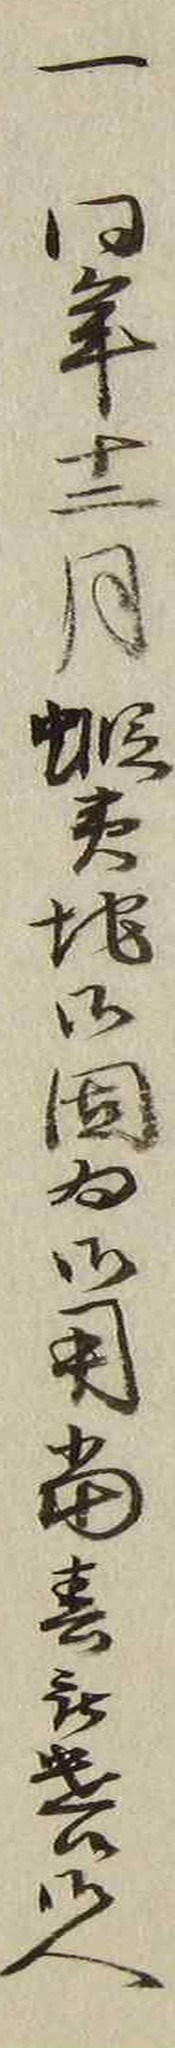一同年十二月蝦夷地御固為御用当春被遣候御人
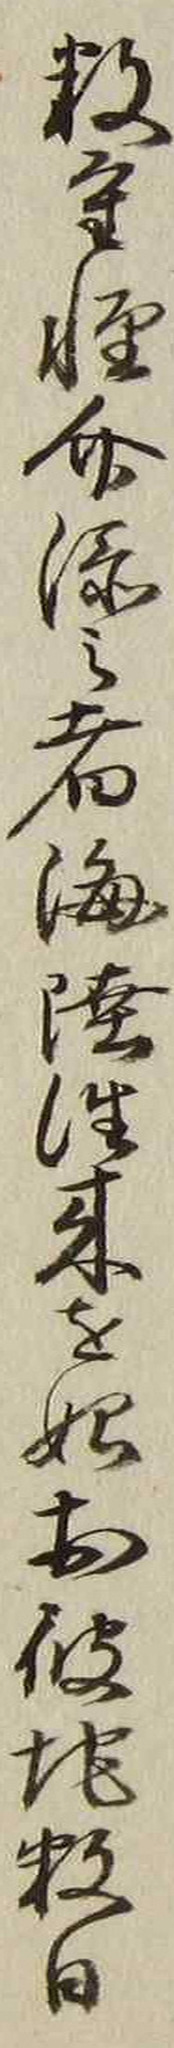数重軽介添之者海陸往来を始於彼地数日
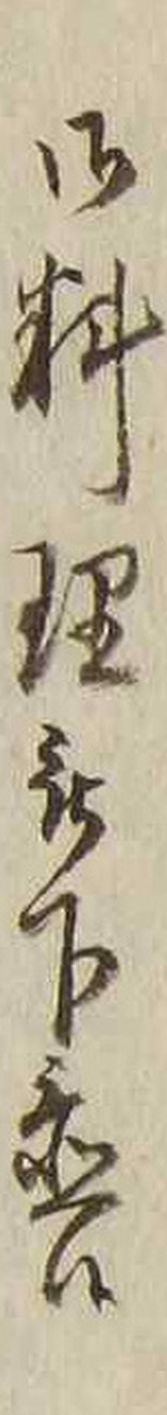御料理被下置候

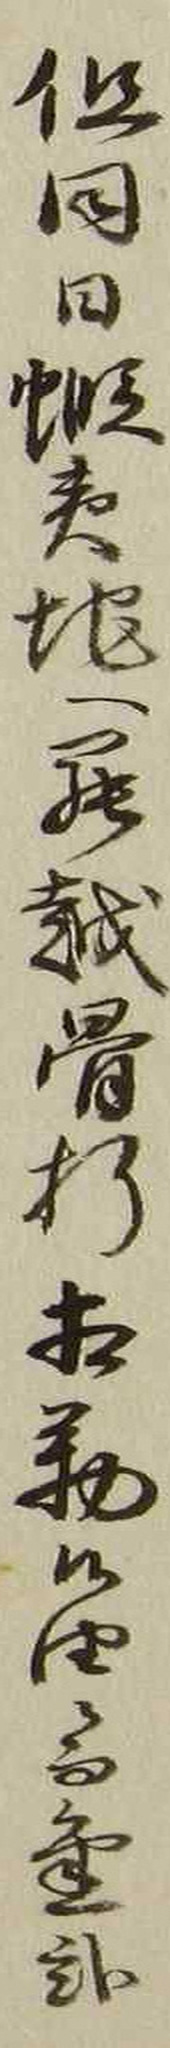但同日蝦夷地へ罷越骨折相勤候由ニ而金弐
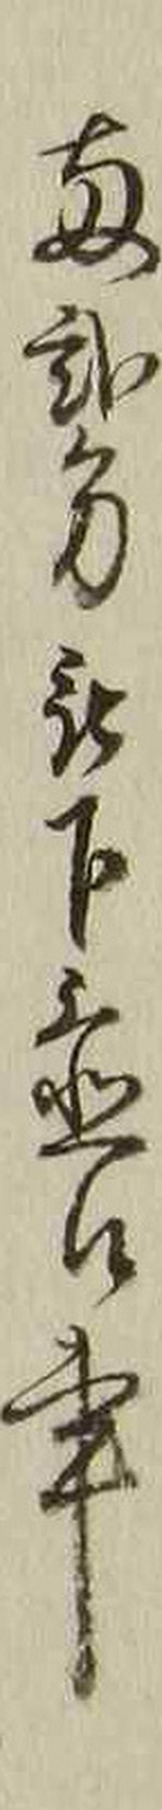両弐分被下置候事
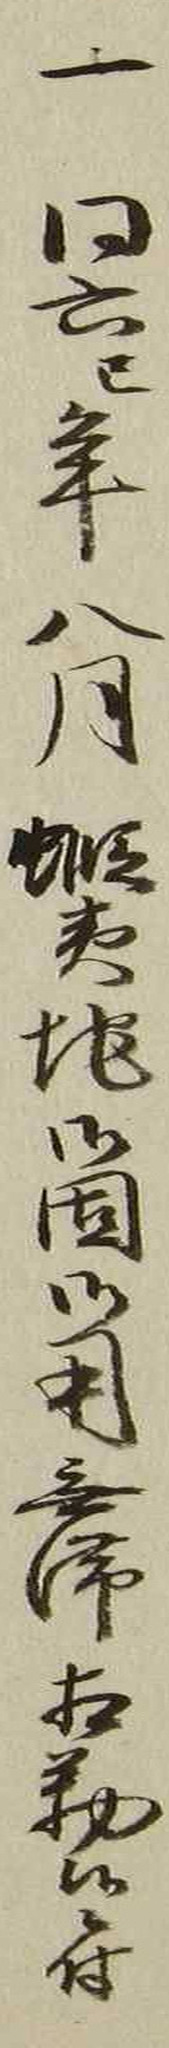一同六巳年八月蝦夷地御固御用無滞相勤候ニ付
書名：諸士系譜　巻之102　か之部10
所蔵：会津若松市立会津図書館
